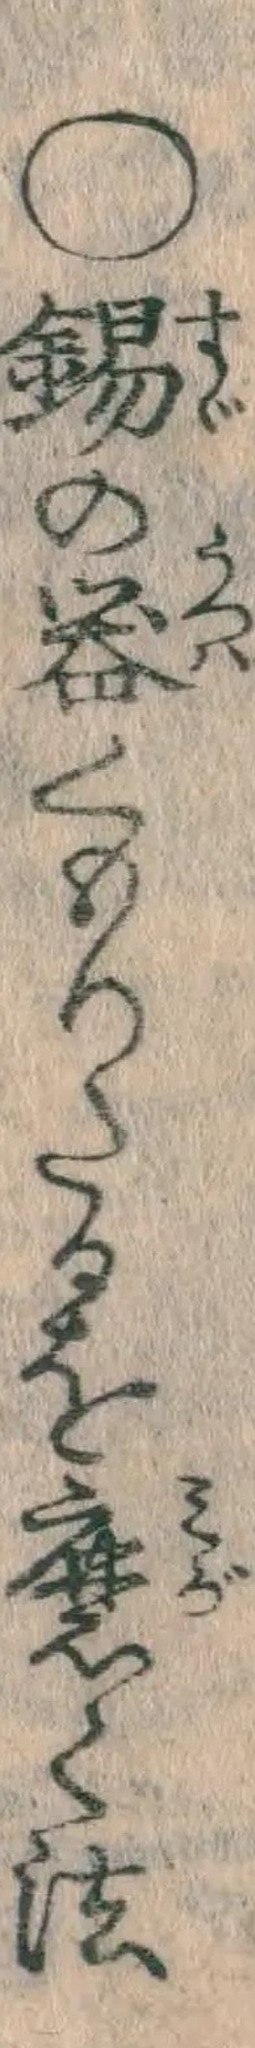○錫の器くもりたるを磨く法
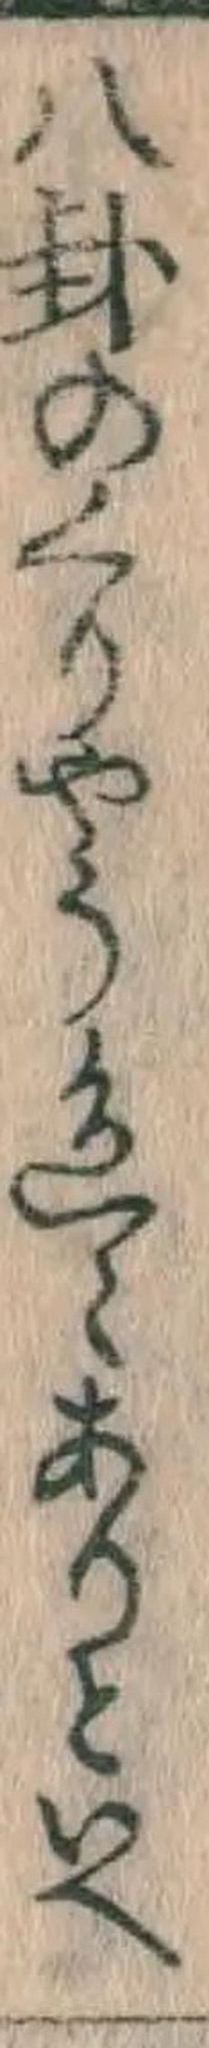八卦のくりやう色々ありといへ
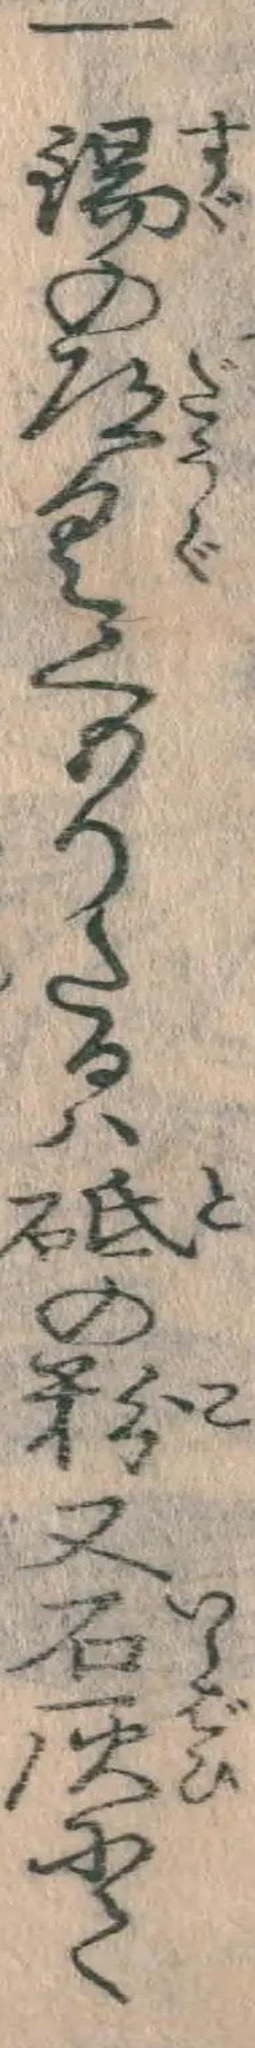一錫の道具くもりたるは砥の粉又石灰にて
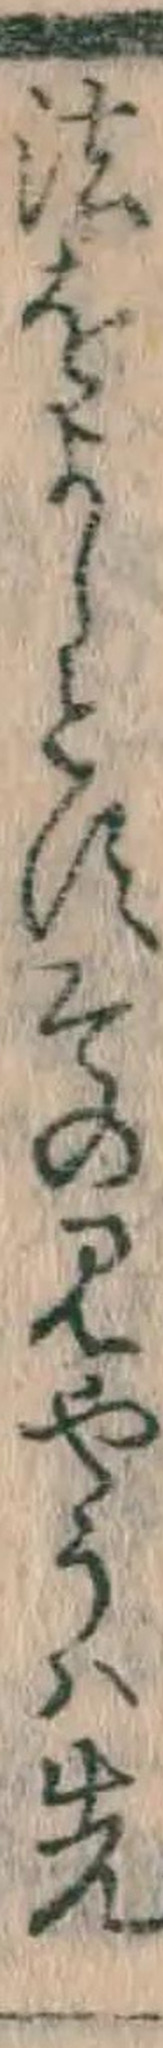法をよしとすその見やうは先
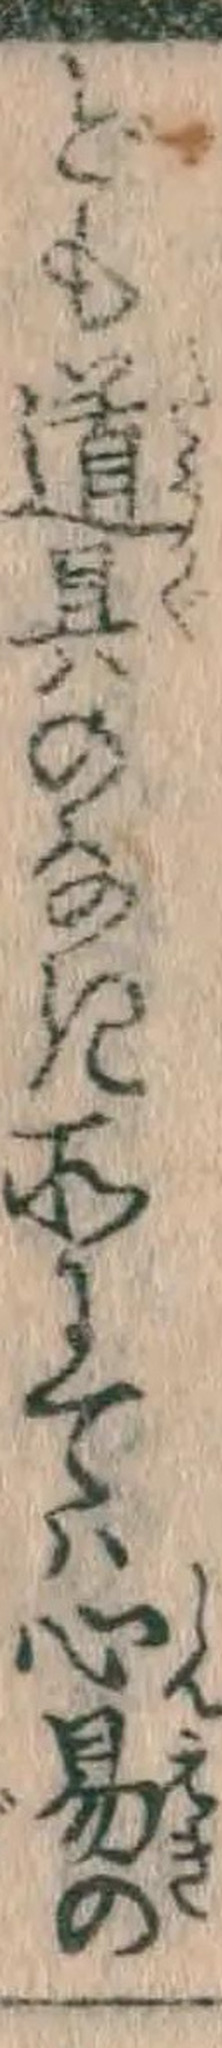ども道具のなき所にては心易の
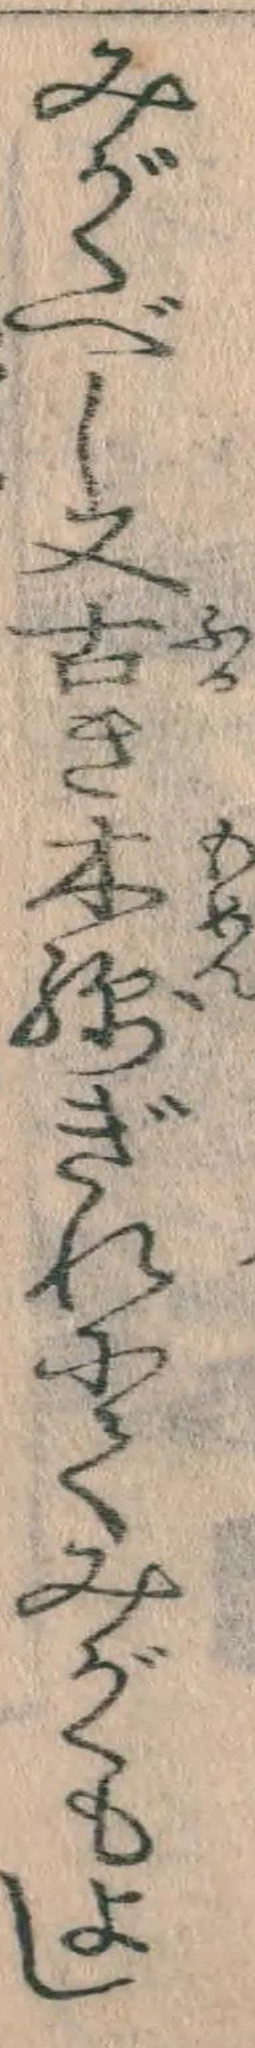みがくべし又古き木綿ぎれにてみがくもよし
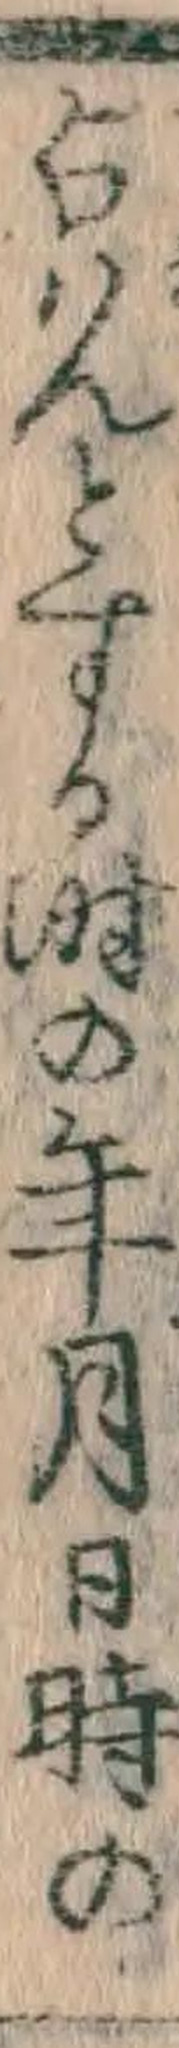占はんとする時の年月日時の
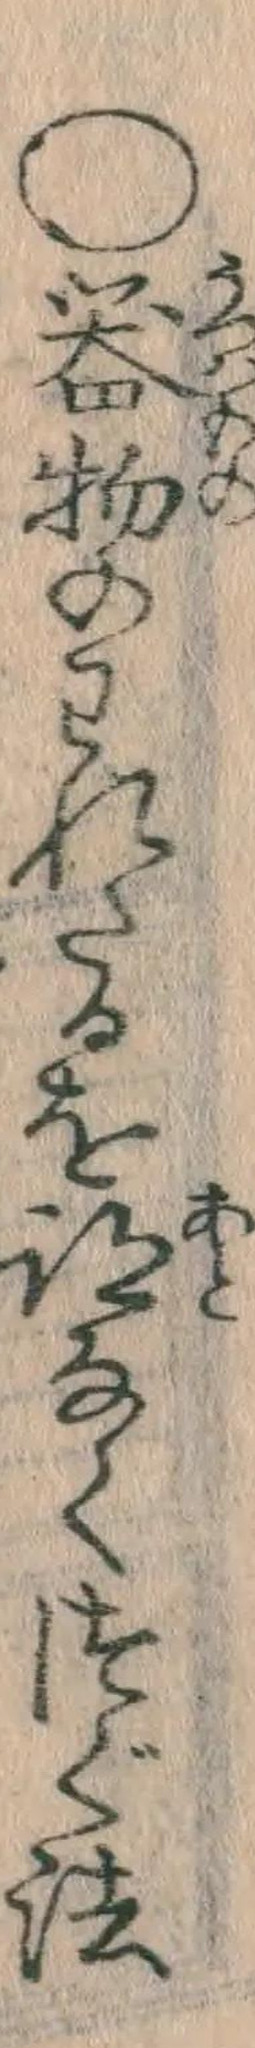○器物のわれたるを跡なくつぐ法
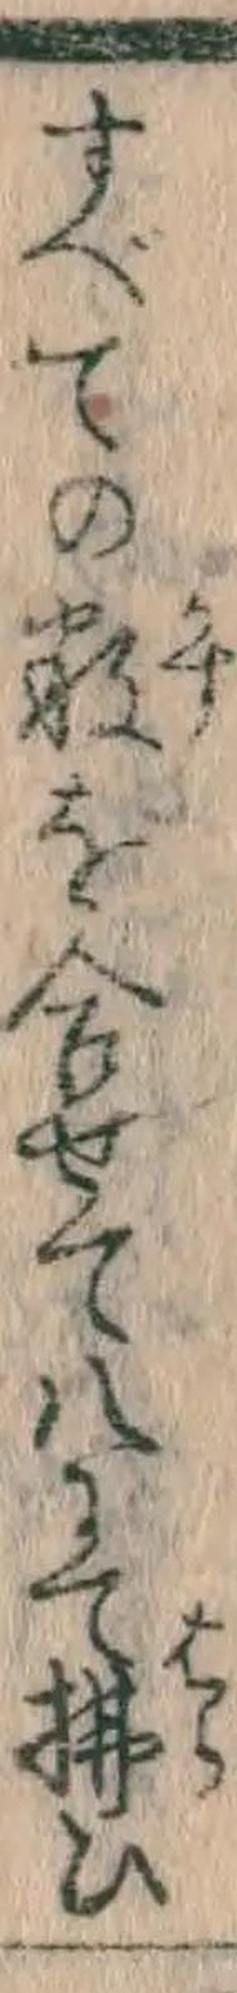すべての数を合せて八にて払ひ
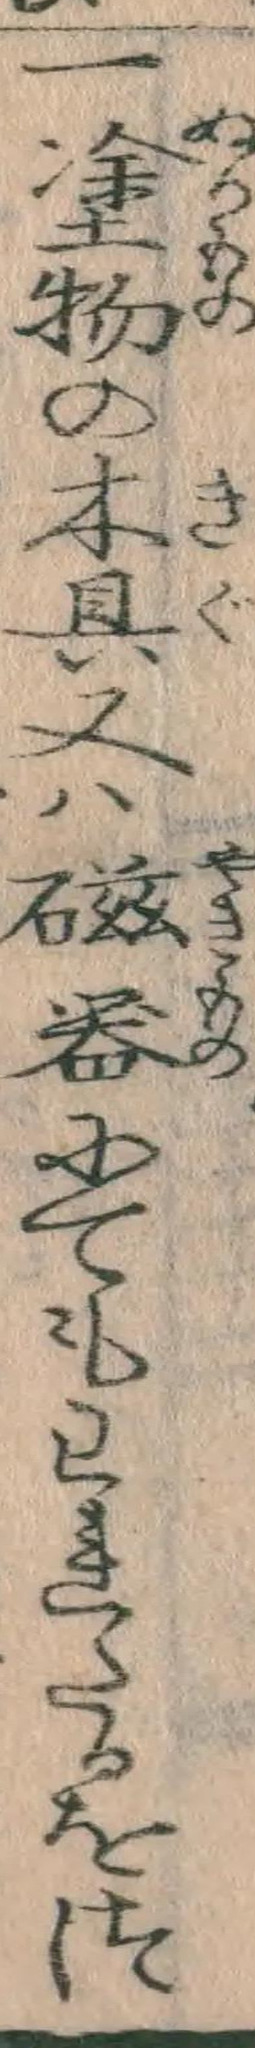一塗物の木具又は磁器にてもわれたるをつ
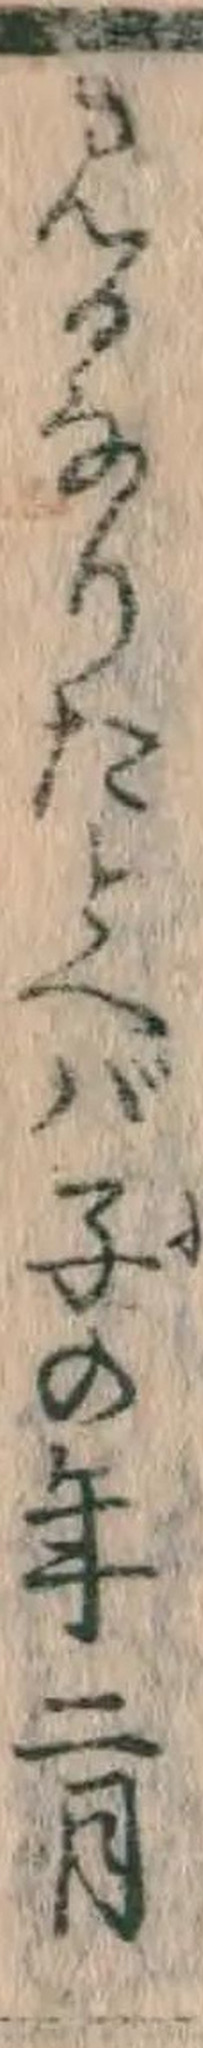見るなりたとへば子の年二月
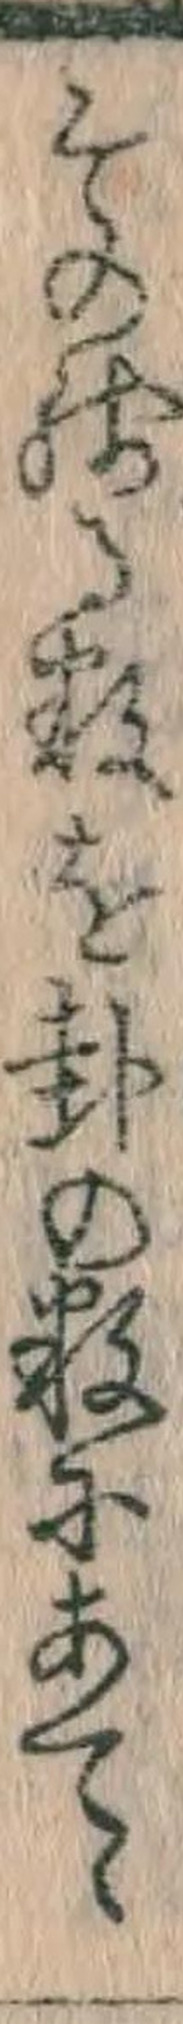その残る数を卦の数にあてゝ
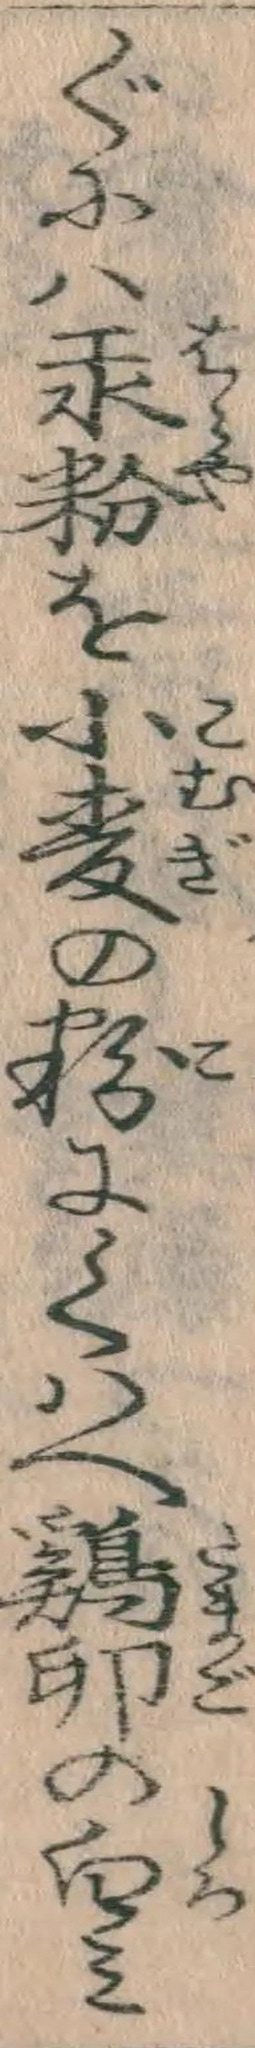ぐには汞粉を小麦の粉にくはへ鶏卵の白み
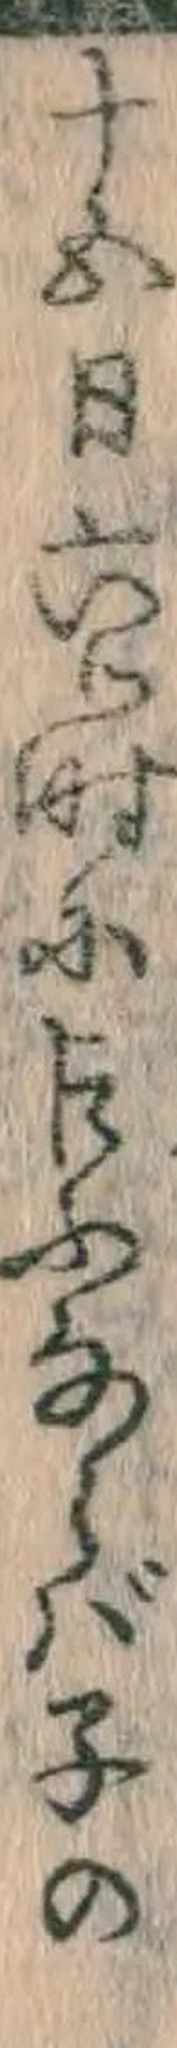十五日六ッ時に占ふならば子の
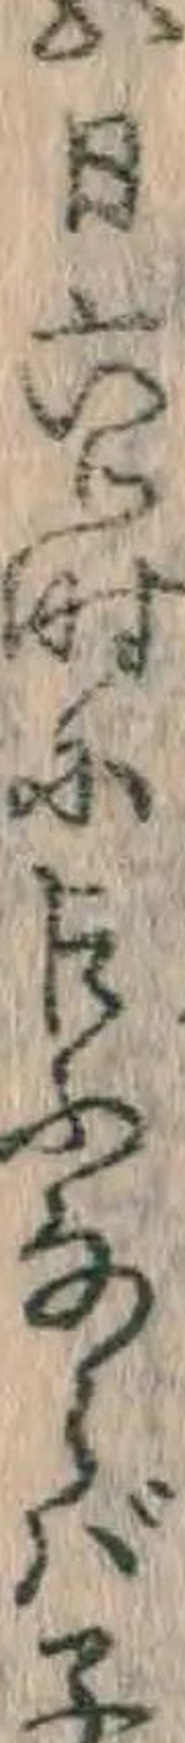十五日六ッ時に占ふならば子の
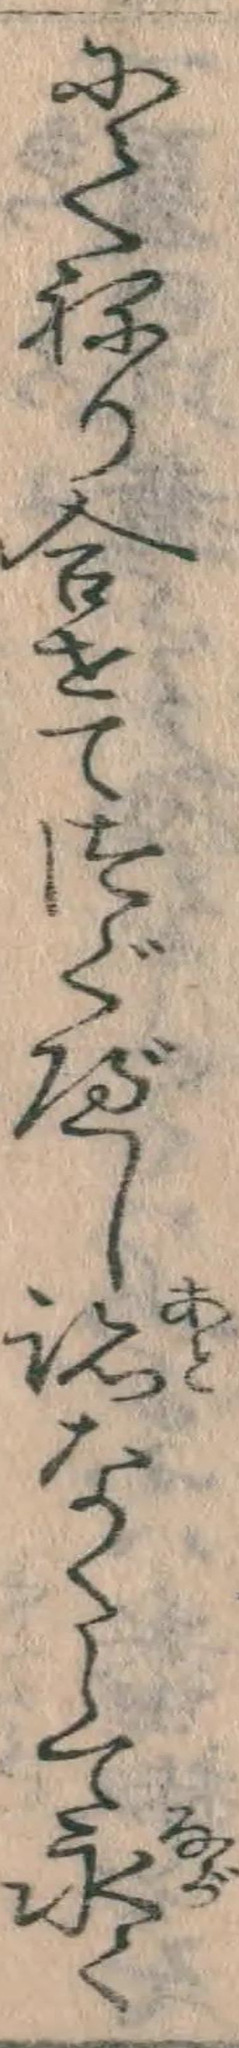にてねり合せてつぐべし跡なくして永く
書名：広益秘事大全 3巻. [1]
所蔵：国立国会図書館 National Diet Library, JAPAN
